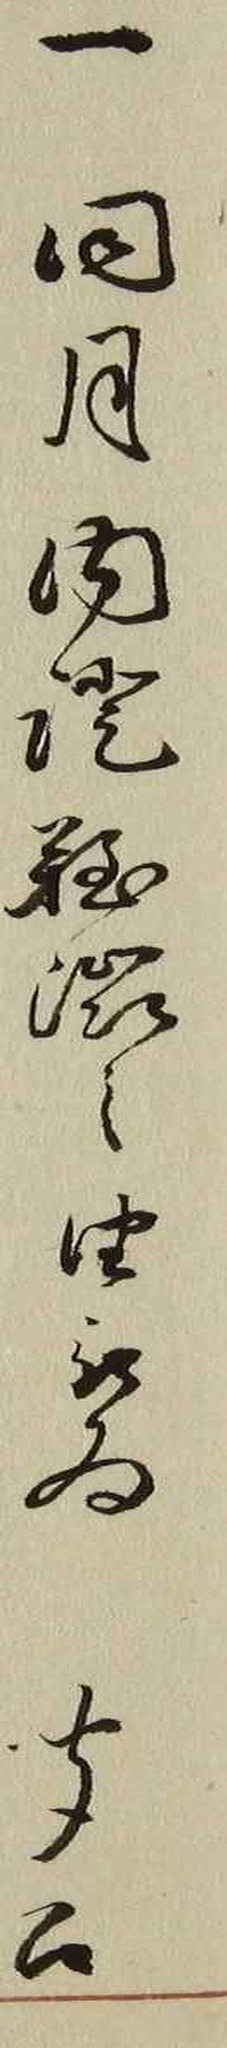一同月内証難渋の由被為聞召
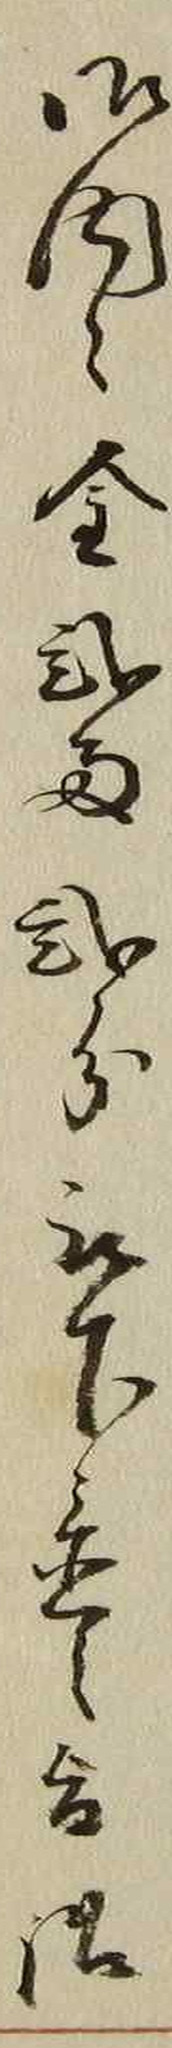御内々金弐両弐分被下置の旨御
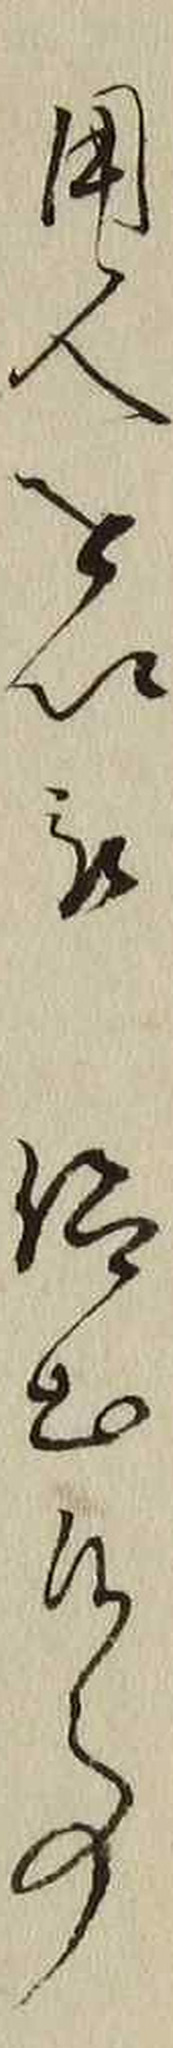用人を以被仰出候事
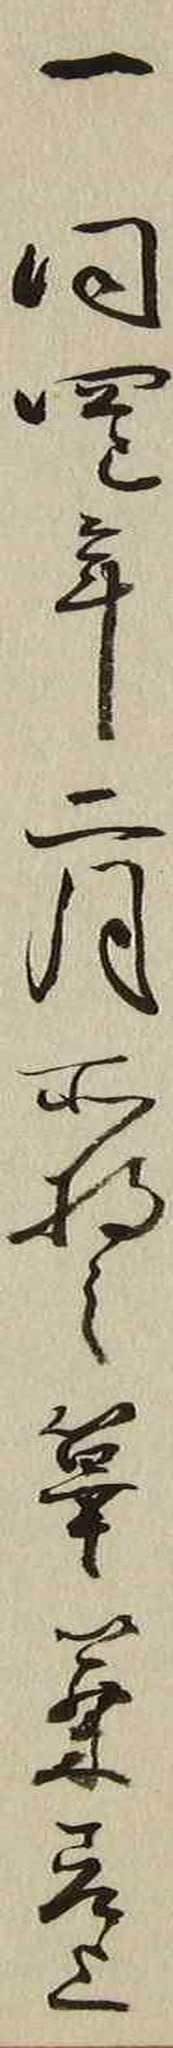一同四巳年二月所持の篳篥差上
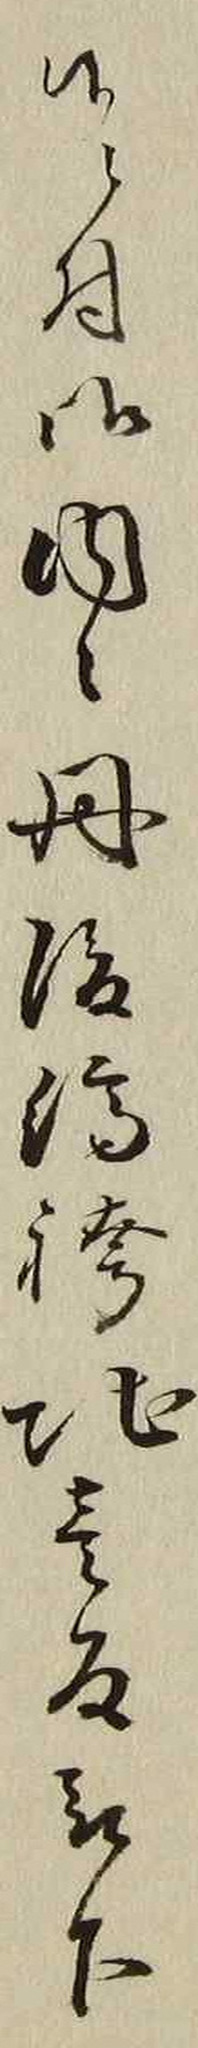候に付御内々丹後縞袴地壱反被下
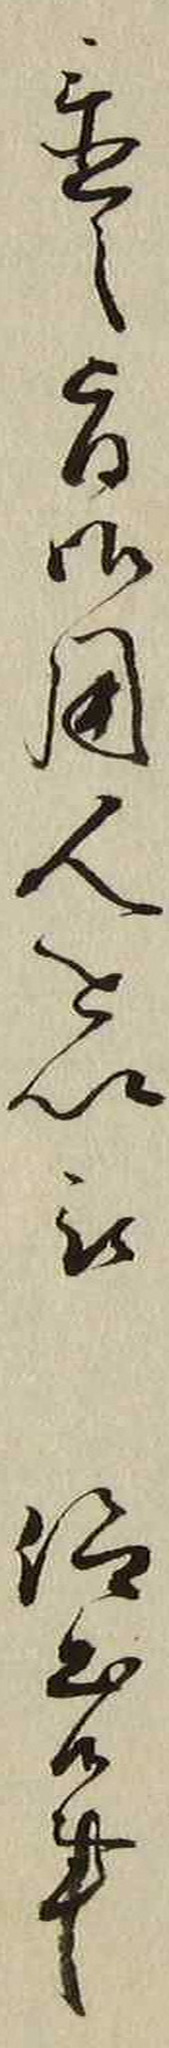置の旨御用人を以被仰出候事
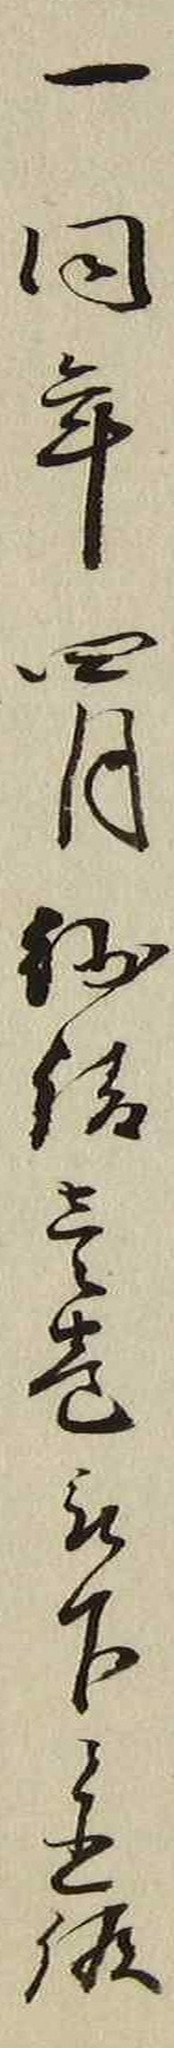一同年四月紗綾壱巻被下置候
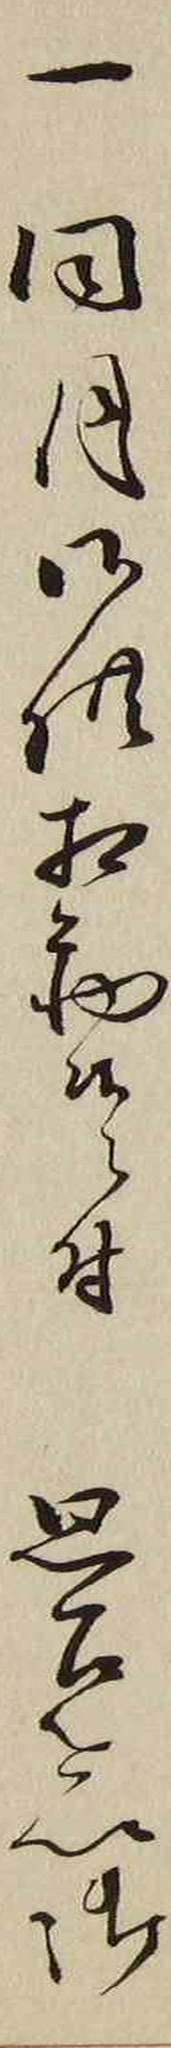一同月御供相勤候に付思召を以御
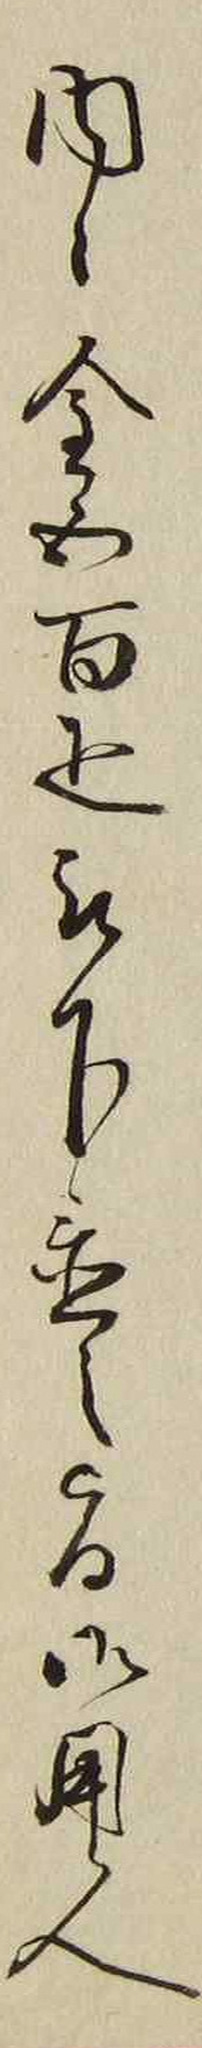内々金五百疋被下置の旨御用人

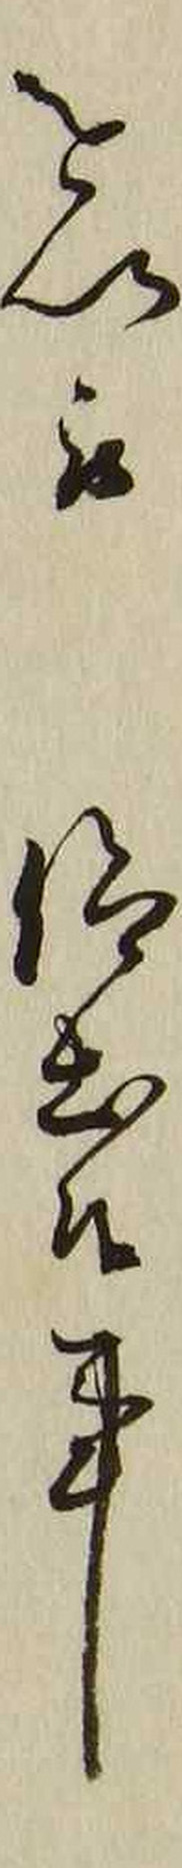を以被仰出候事
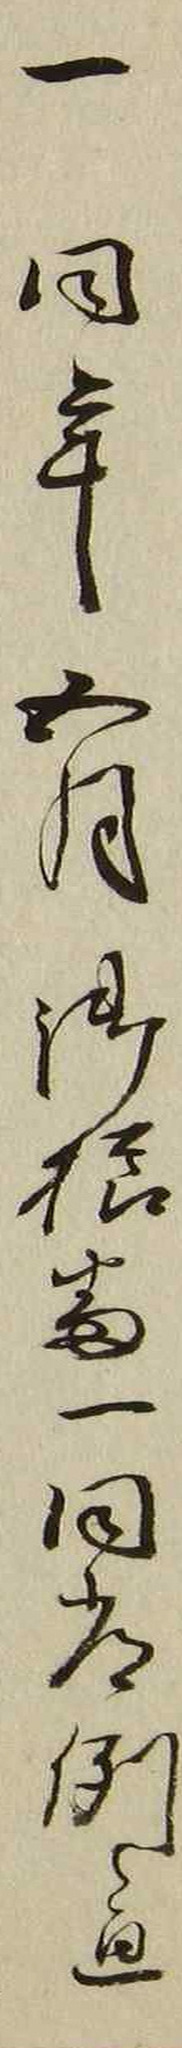一同年五月御様番一同常例の通
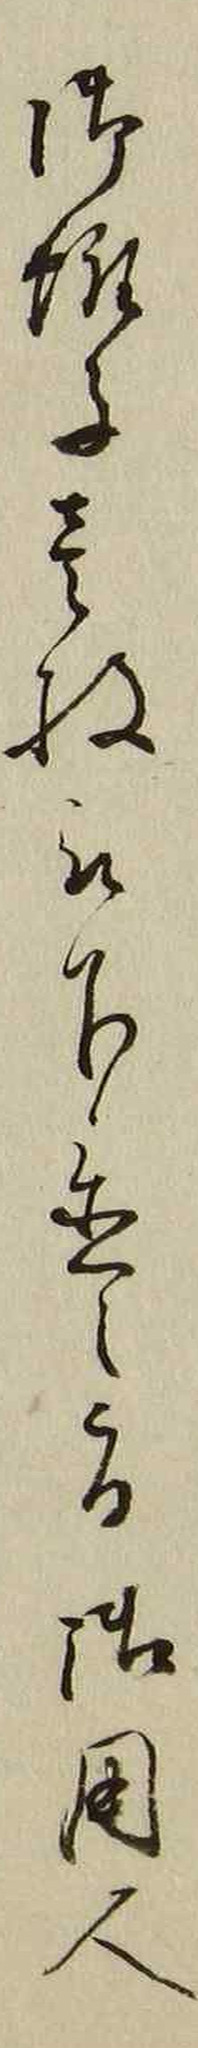御帷子壱枚被下置の旨御用人
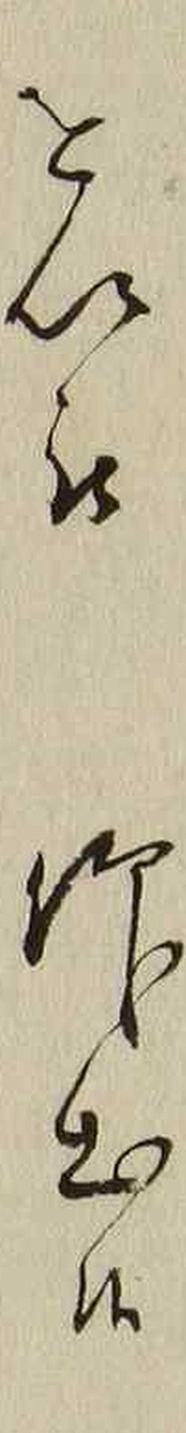を以被仰出候
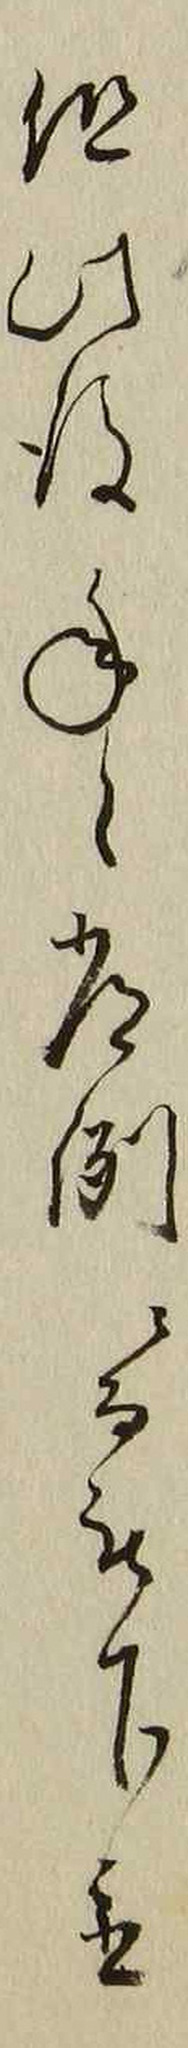但此後年々常例に而被下置
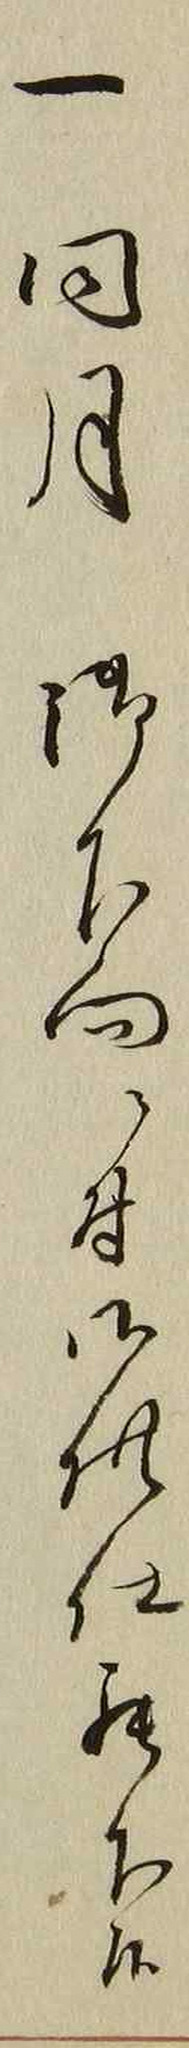一同月御下向に付御供仕罷下候
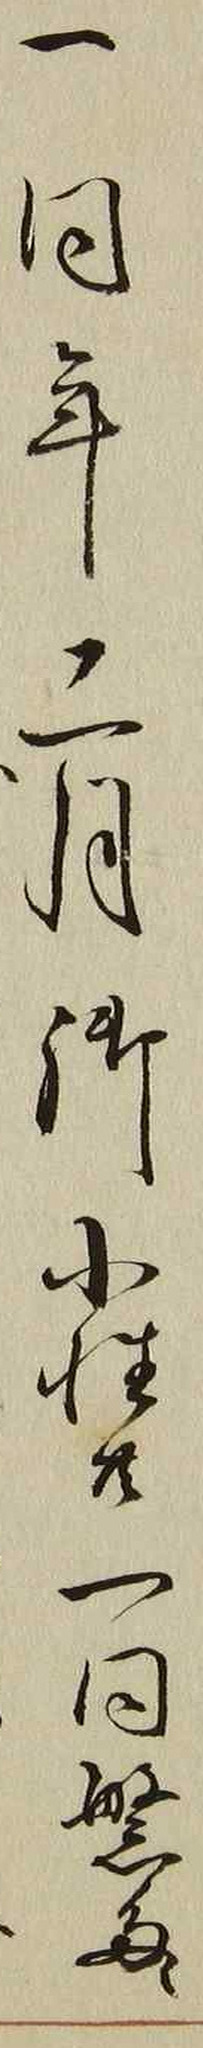一同年二月御小性共一同繁多に
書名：諸士系譜　巻之1　い之部1
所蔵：会津若松市立会津図書館
